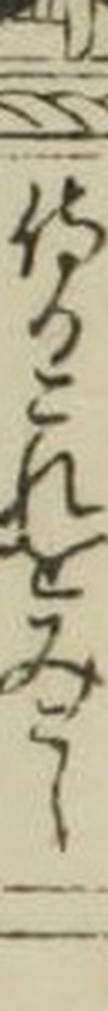侍るこれをみこし
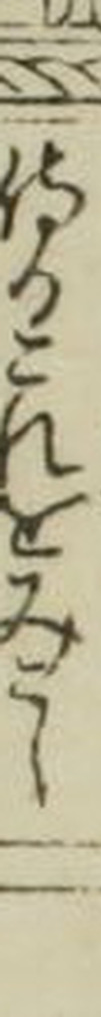侍るこれをみこし
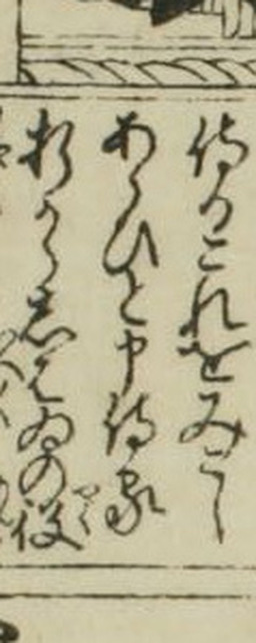あらひと申侍る
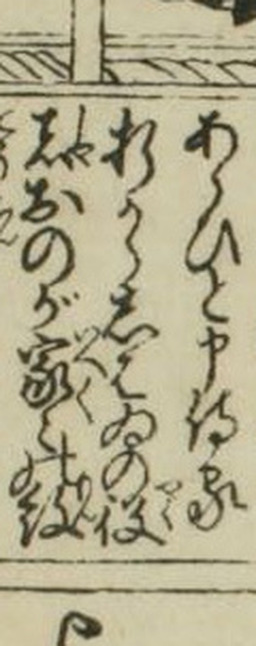折からしはゐの役
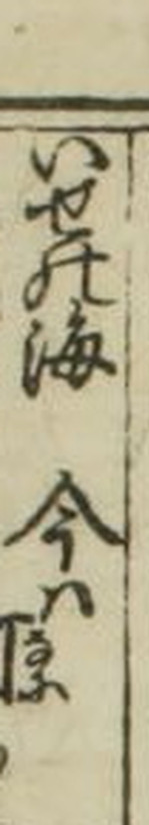いせの海今は
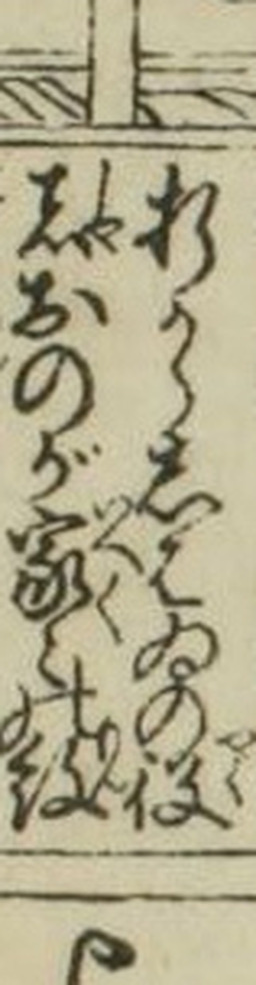者おのが家々の紋
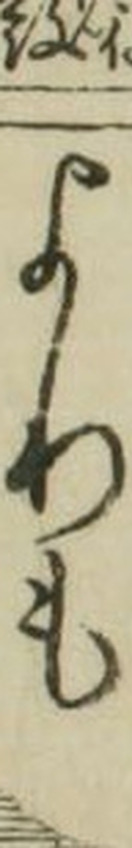よりも
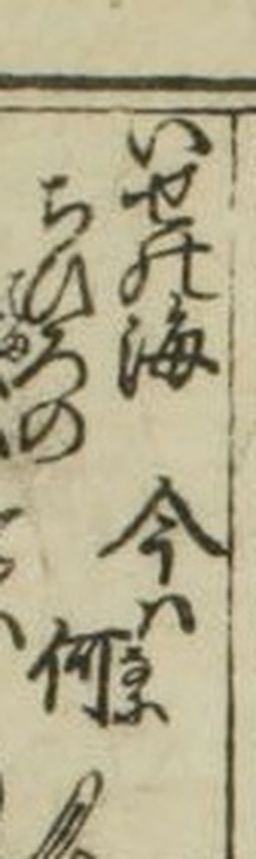ちひろの何
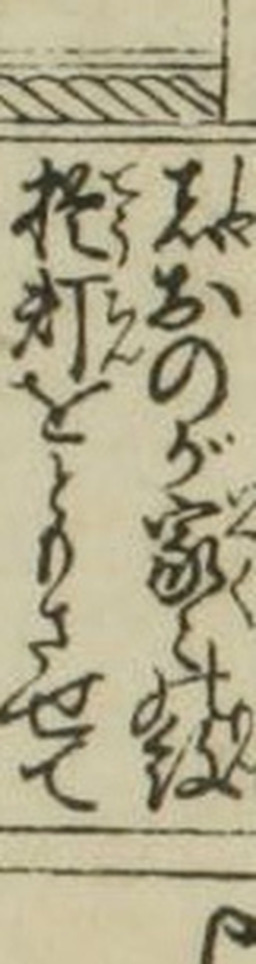提灯をともさせて
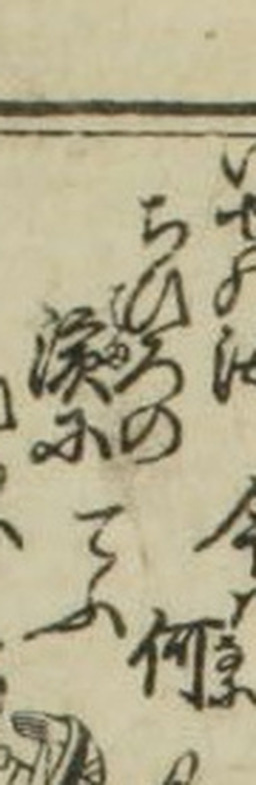浜にてふ
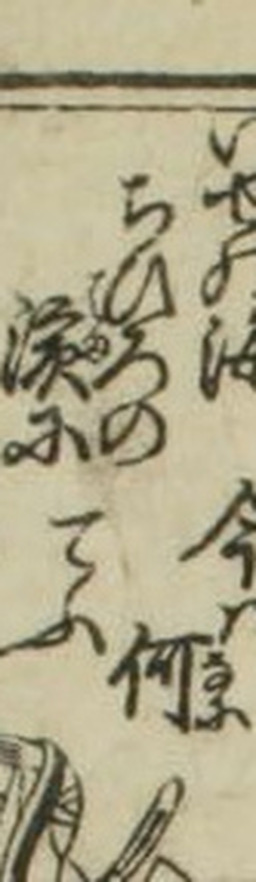浜にてふ
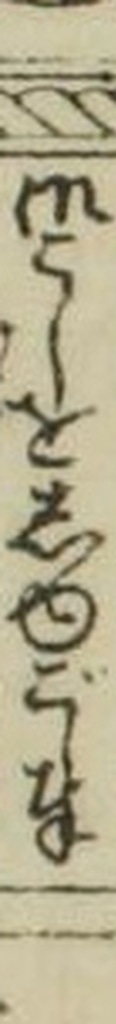御こしをしゆごし奉
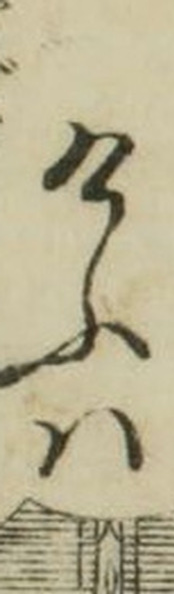けふは
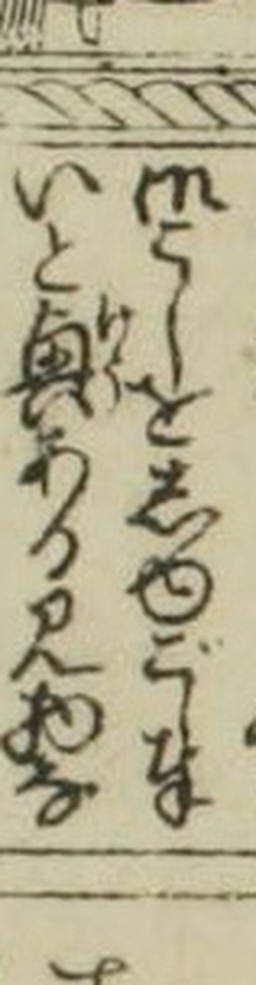いと興ある見物な
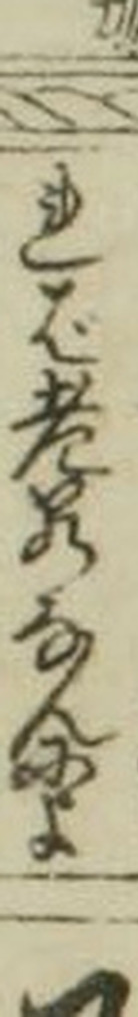れば老若なんによ
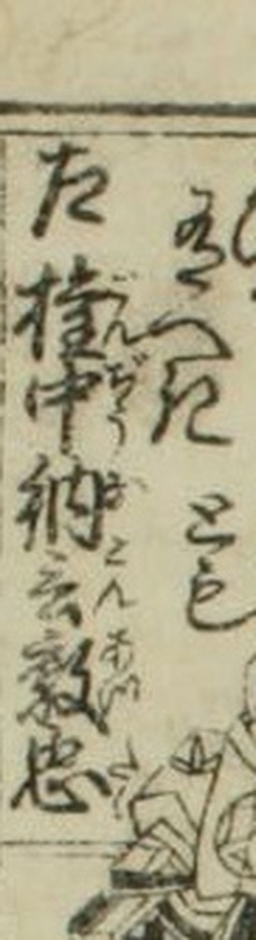左権中納言敦忠
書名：女源氏教訓鑑
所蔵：東京学芸大学附属図書館
